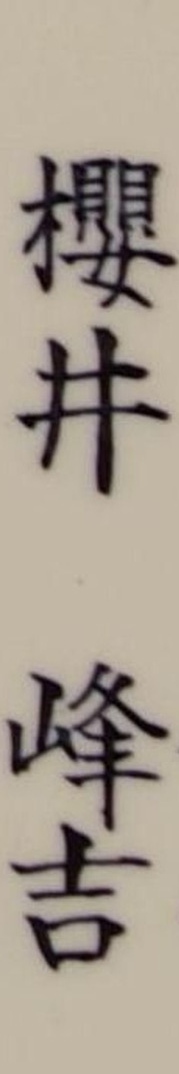桜井峰吉
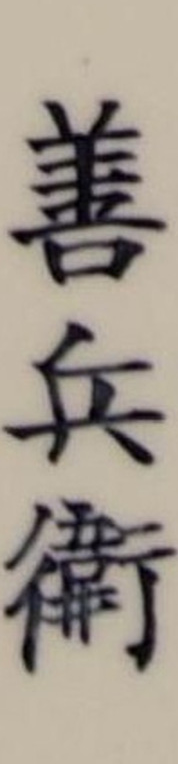善兵衛
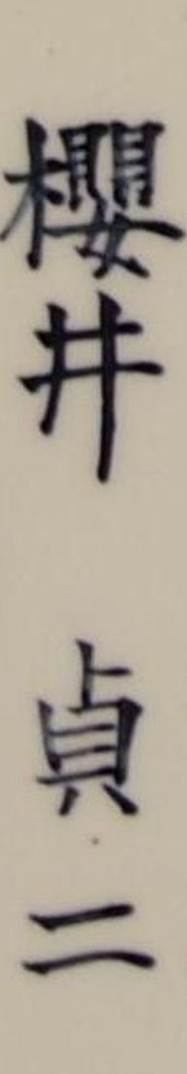桜井貞二
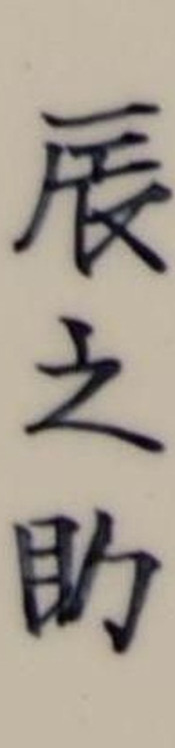辰之助
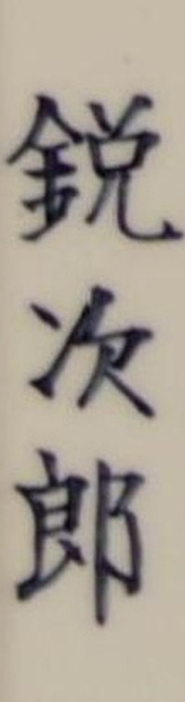鋭次郎

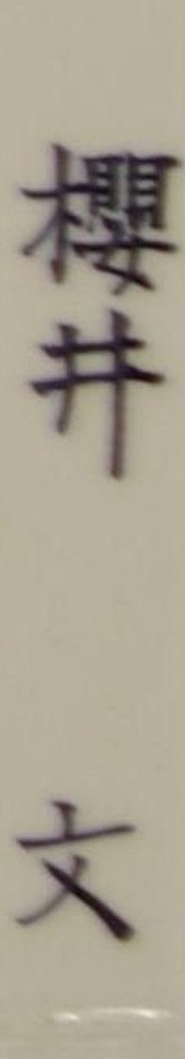桜井文
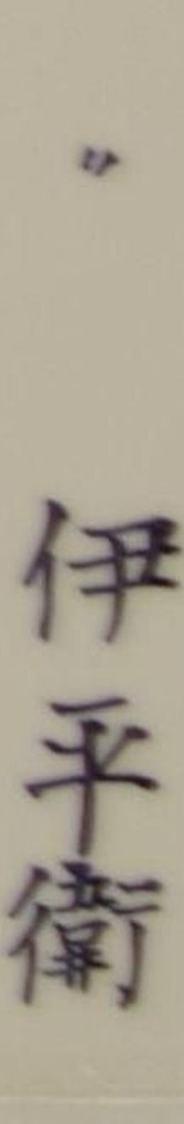伊平衛
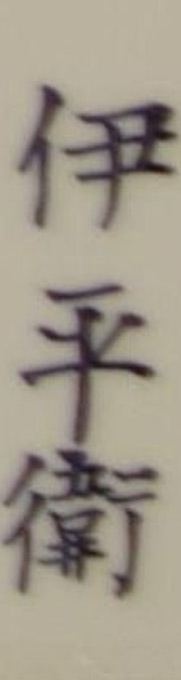伊平衛
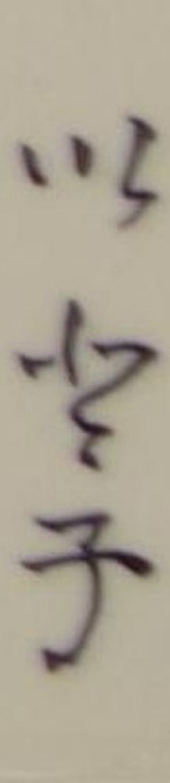いと子
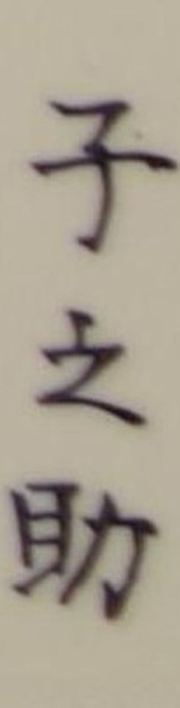子之助
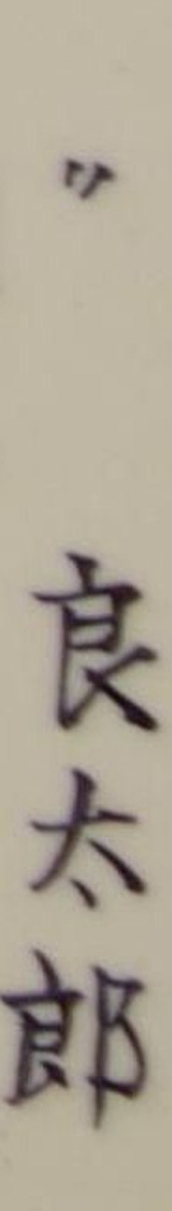良太郎
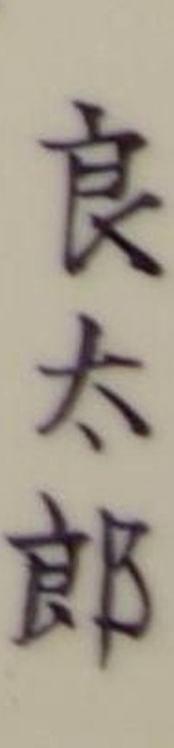良太郎
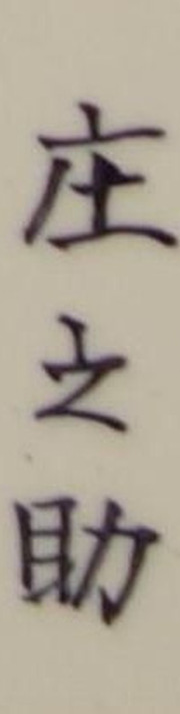庄之助
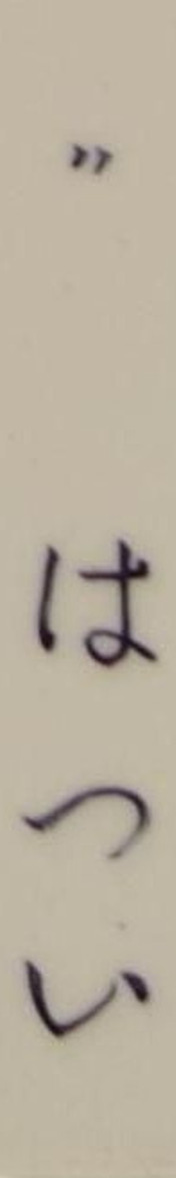はつい
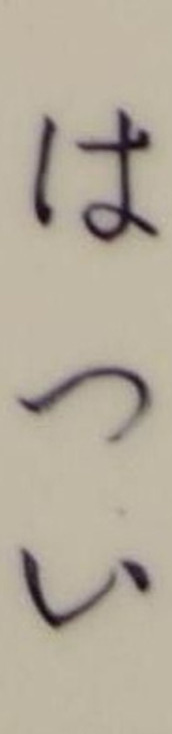はつい
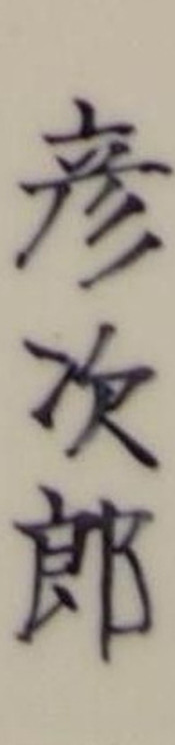彦次郎
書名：E~L
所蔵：高野山金剛峯寺
